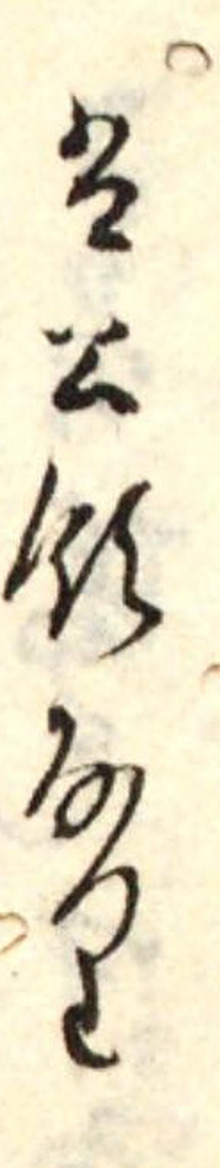は公領なり
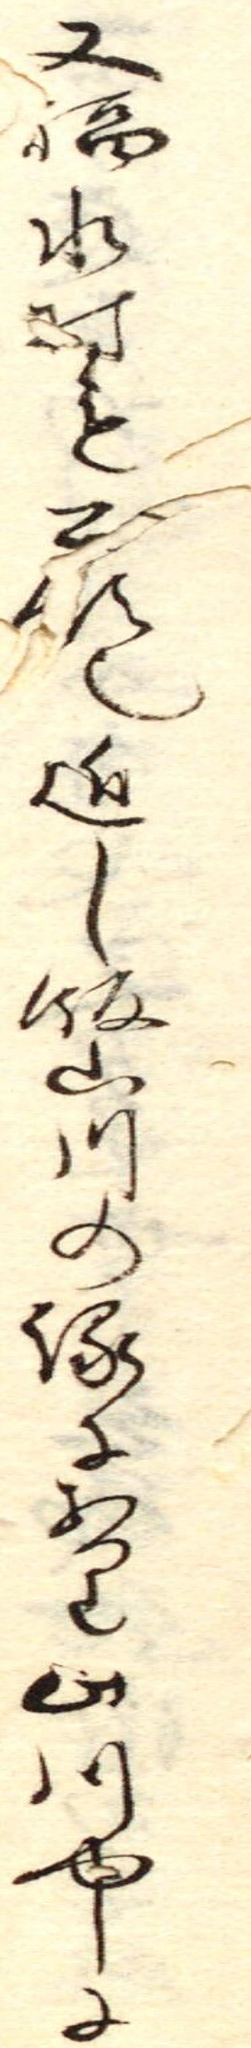又福水村も公領也近し飯山川の縁にあり此川中に
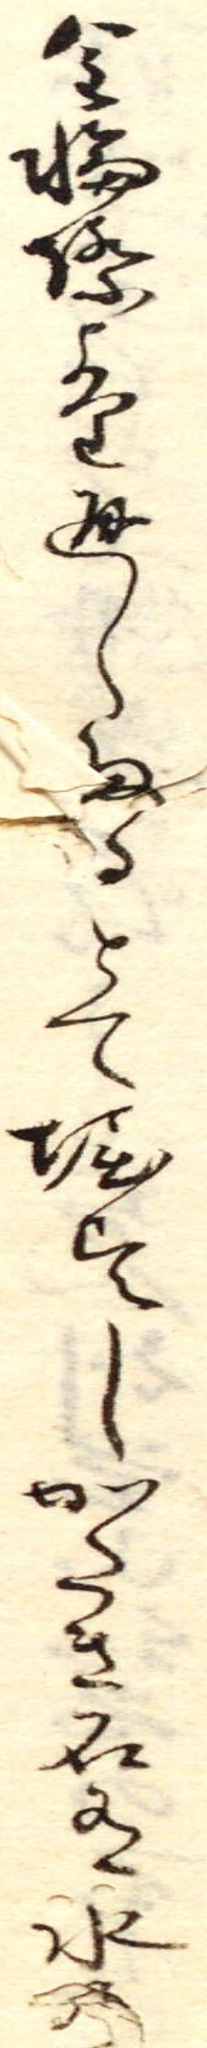金輪際より通したるとて堀尽しかたき石有水の
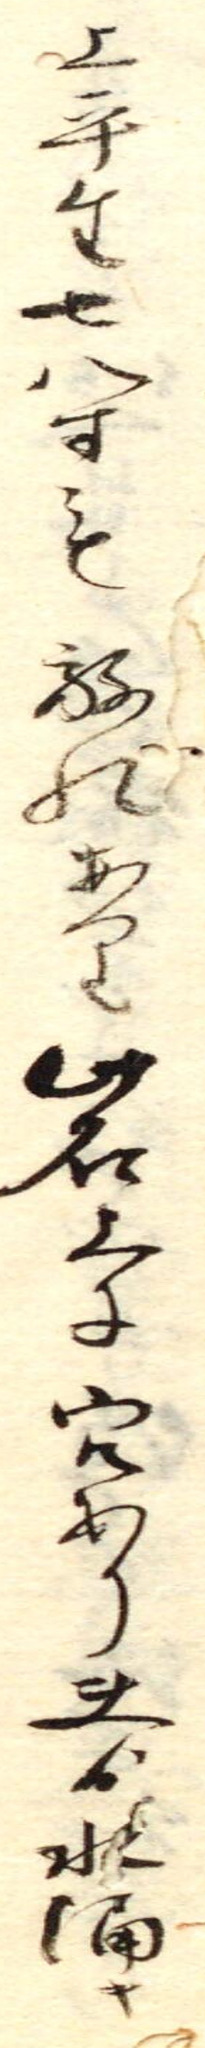上平生七八寸も放れあり此石上に穴あり夫ゟ水涌き
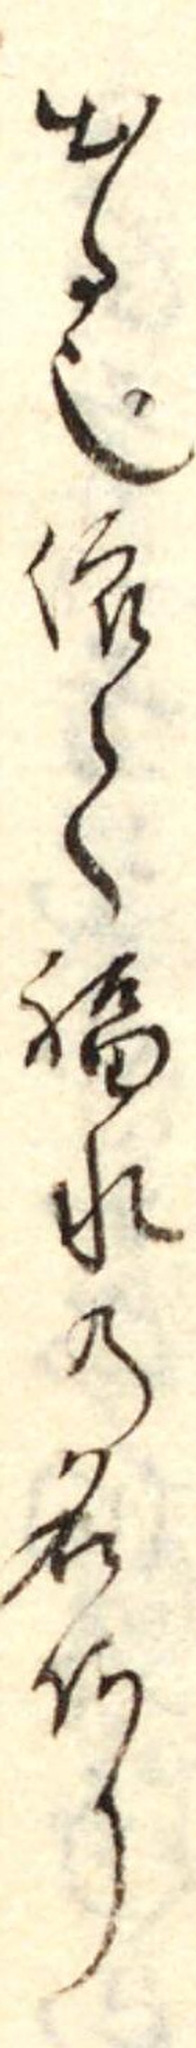出る也依て福水の名あり
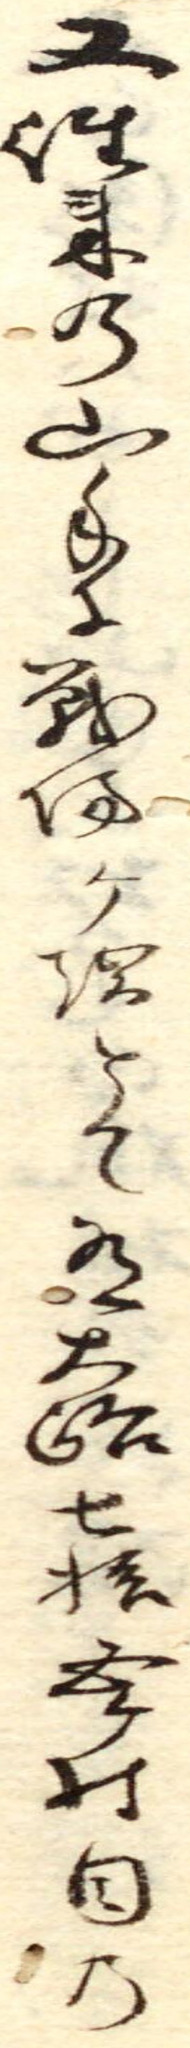又往来の山手に戦場ヶ端とて有大路七拾五ヶ村目の
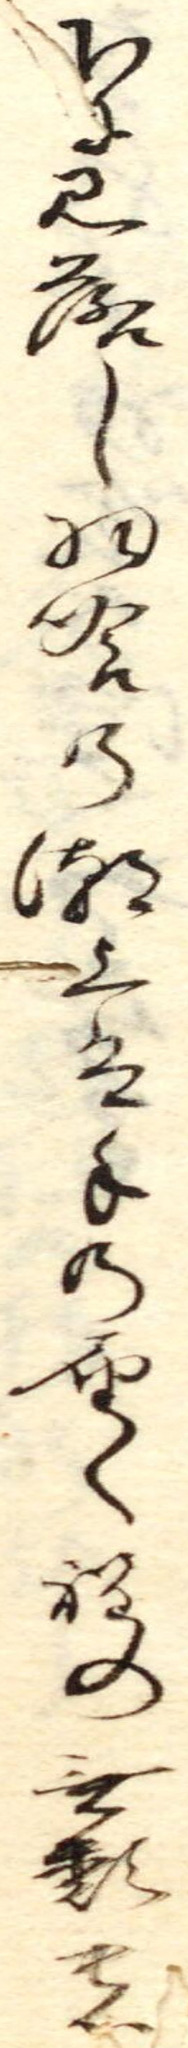下に見落し羽喰の潮上は手の届く程の無類の
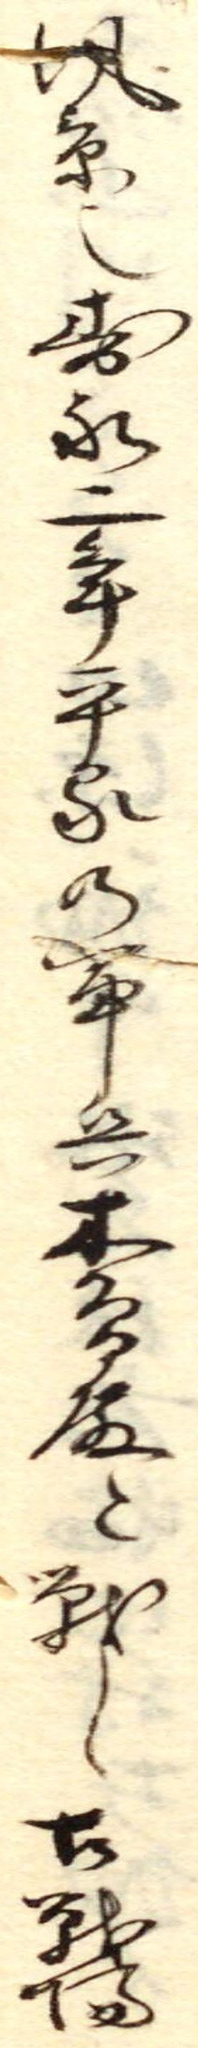風景也寿永二年平家の軍兵木曽殿と戦し古戦場
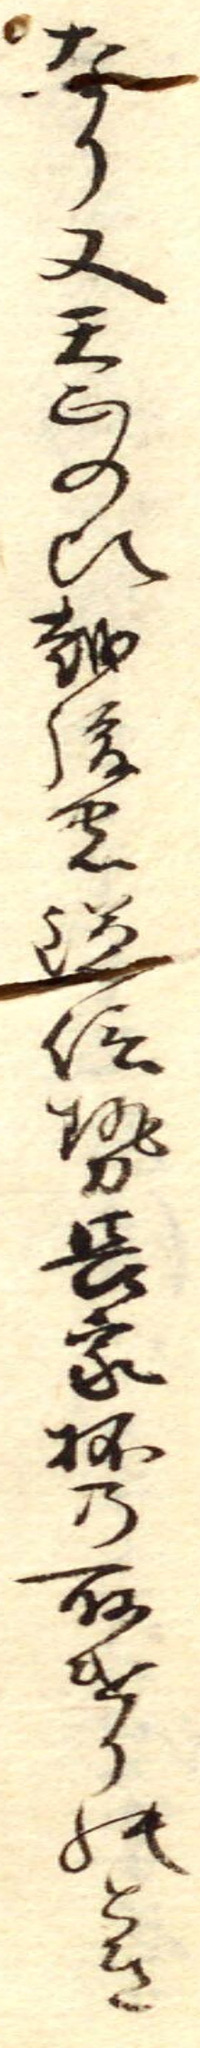なり又天正の比越後の謙信勢長家抔の取遣りのとき
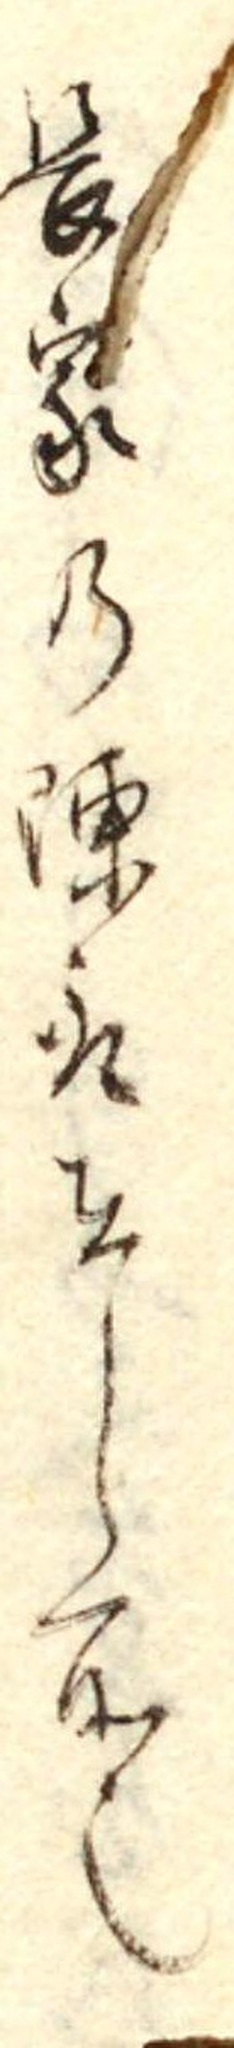長家の陣取在し所也
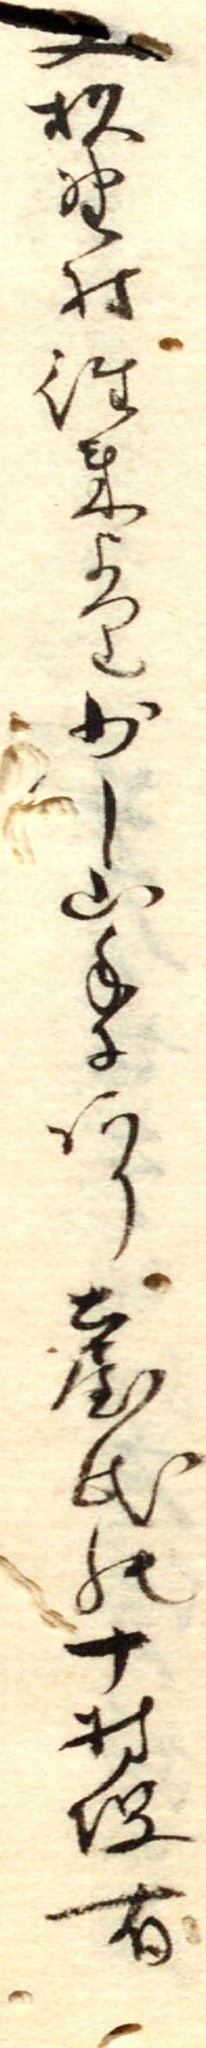又杉野村往来より少し山手にあり土屋氏の十村役有
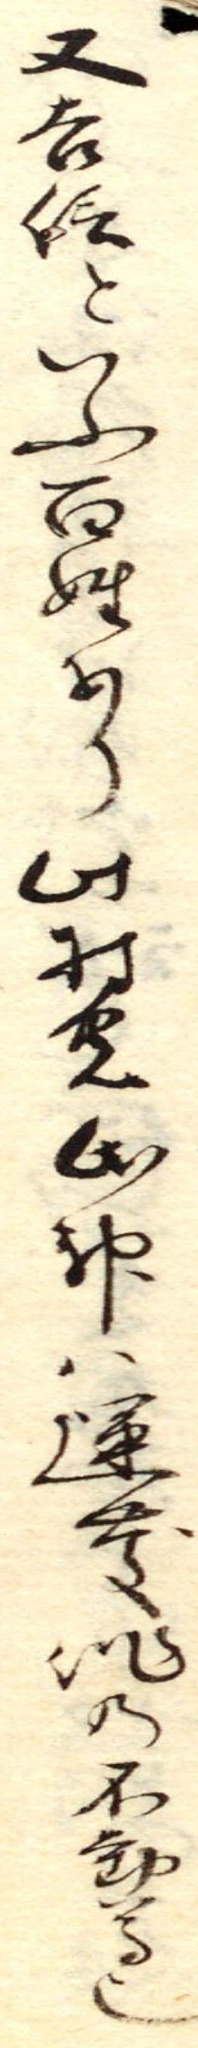又吉信といふ百姓あり此村の氏神は運慶作の不動尊也
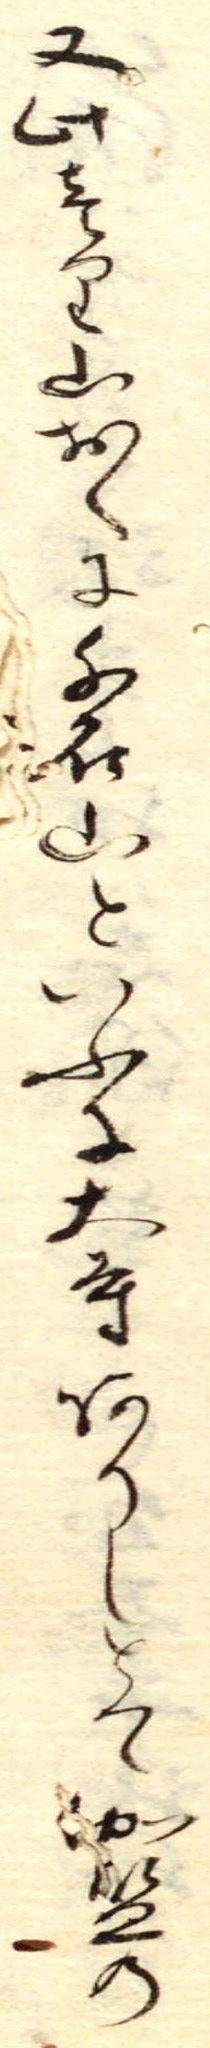又此壱里山おくに千石山といふに大寺ありしとて伽藍の
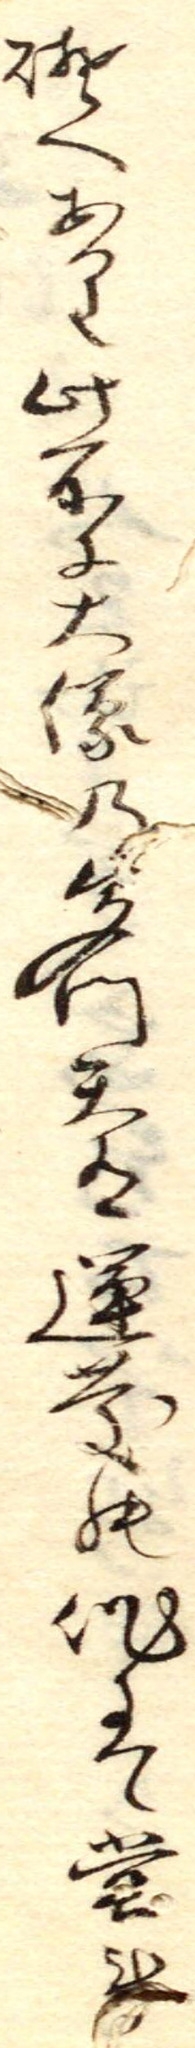礎へあり此所に大像の多門天有運慶の作にて堂計
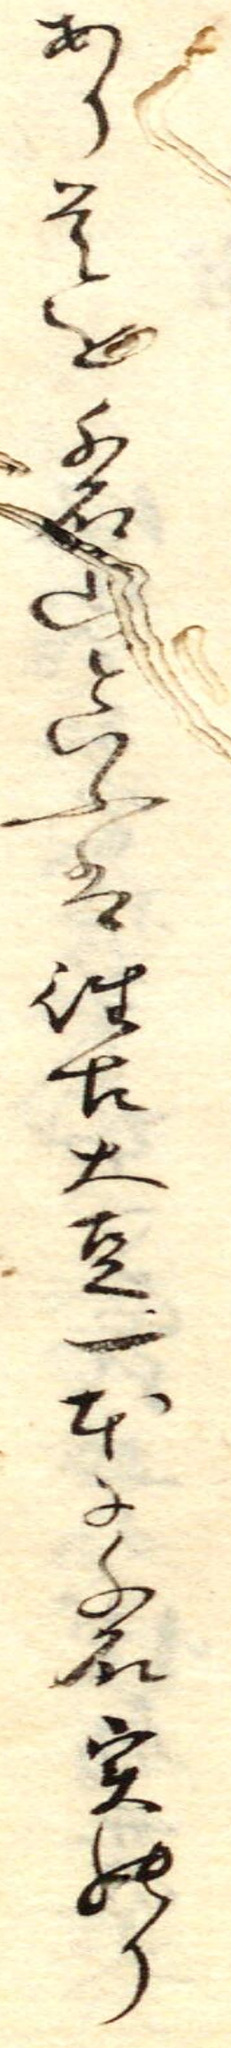あり是を千石山といふは往古大豆一本に千石実のり
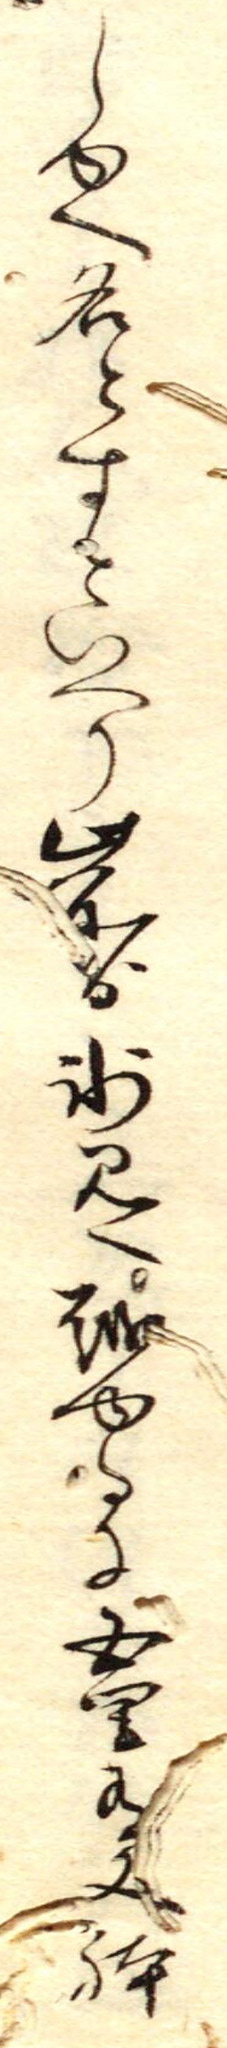しゆへ名とすといへり此所ゟ氷見へ越ゆるに五里有又躰
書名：能登名跡誌
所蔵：Ishikawa Prefectural Library
